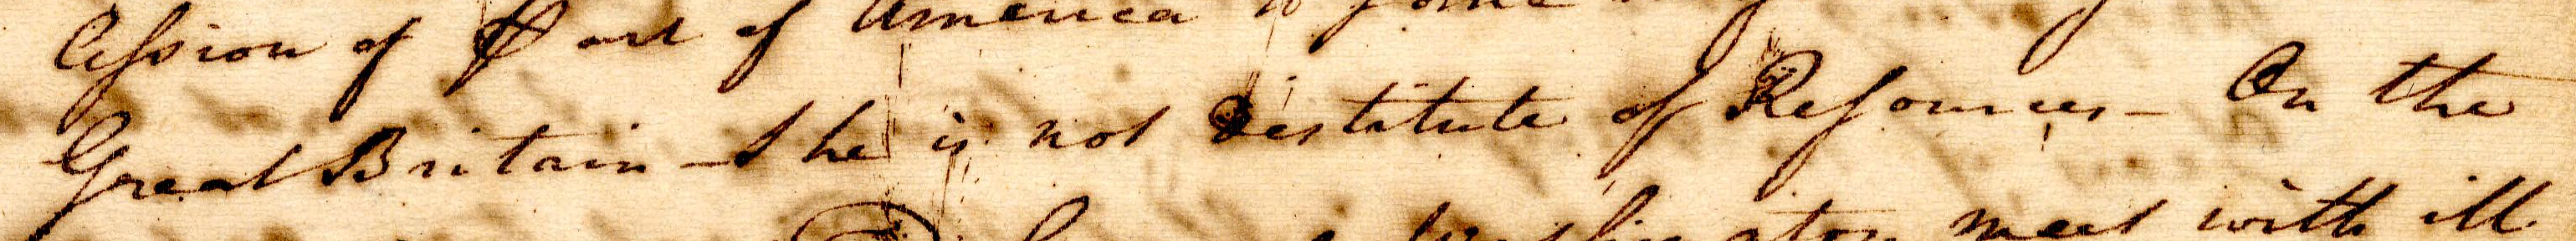Greal Britain- She is not Destitute of Resources- On the
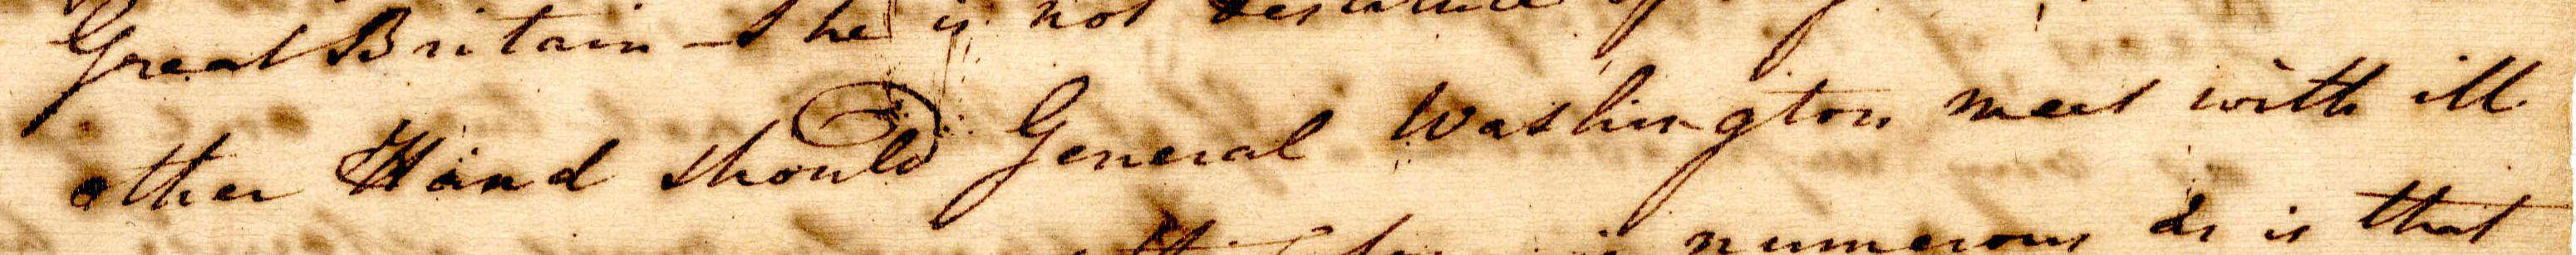other Hand should General Washington meet with ill
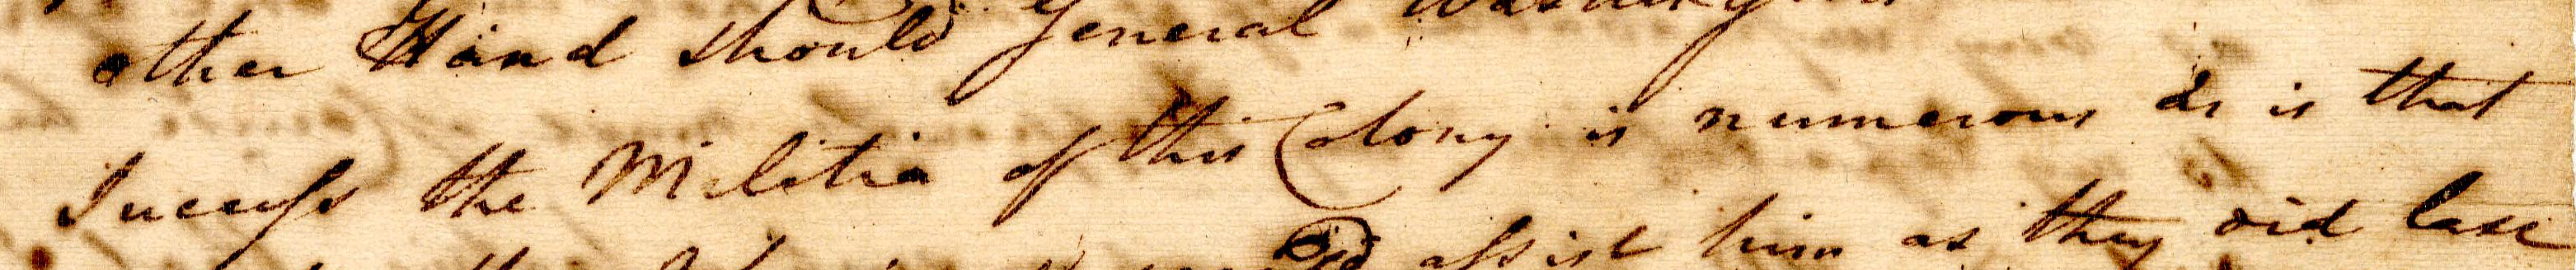success the Militia of this Colony is numerous as is that
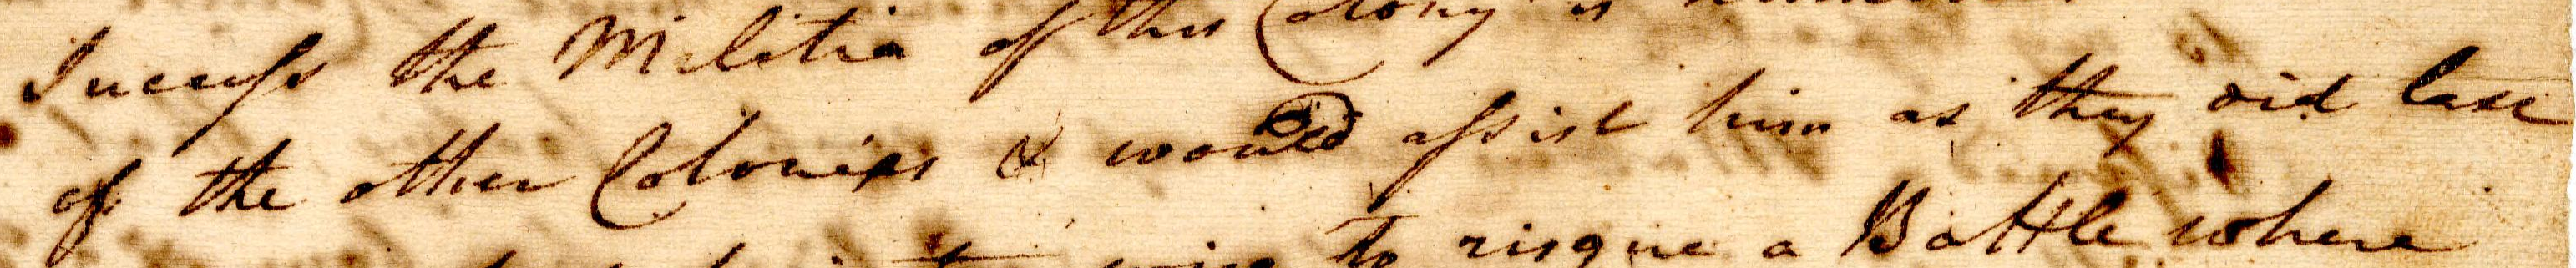of the other Colonies & would assist him as they did last
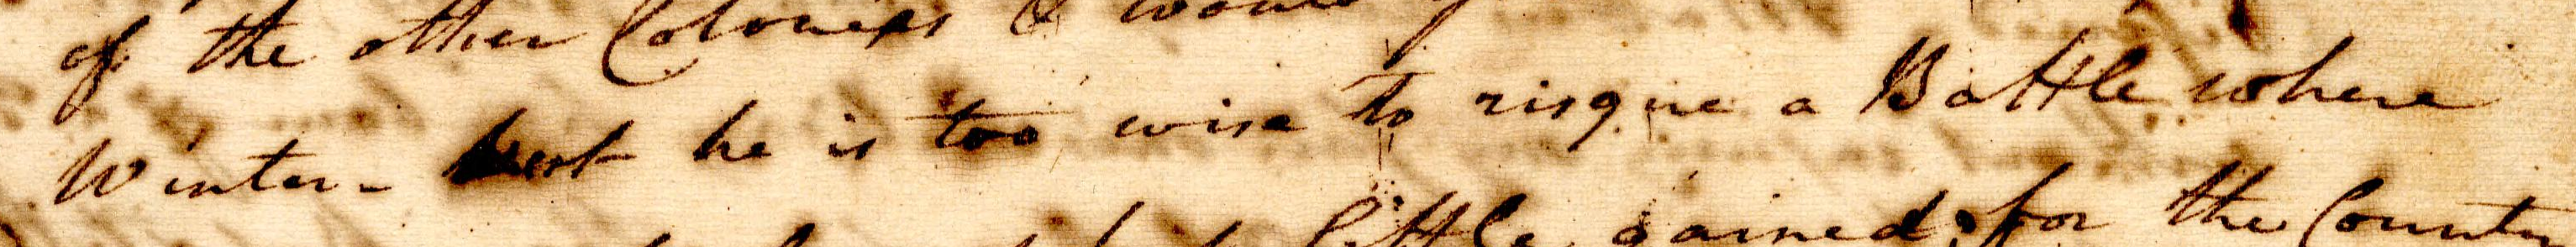Winter- but he is too wise to risque a Battle where
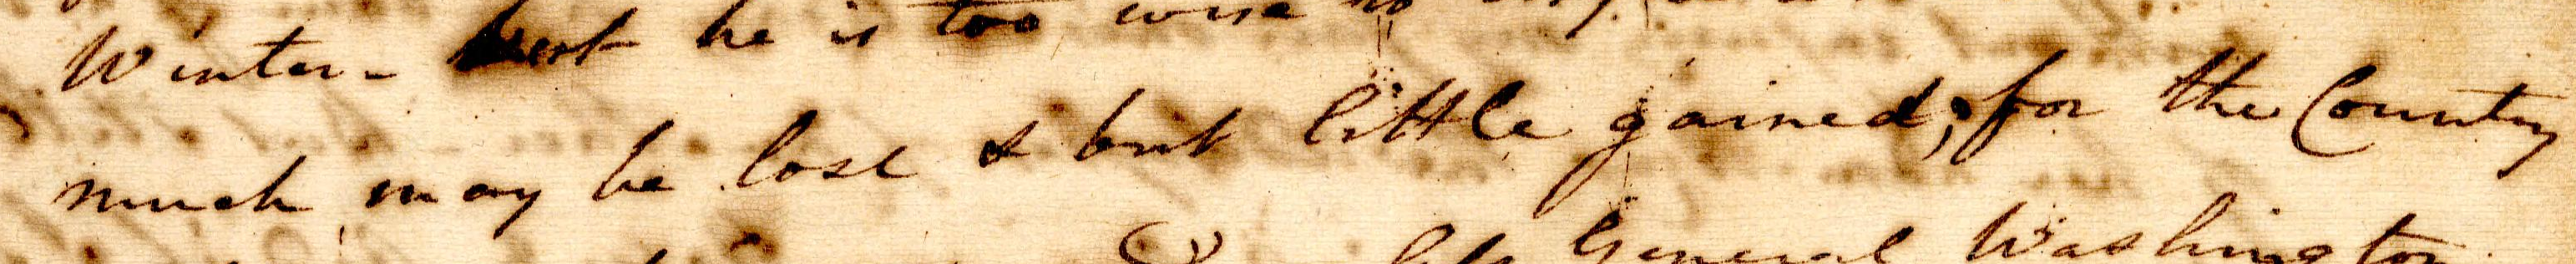much may be lost & but little gained; for the Country
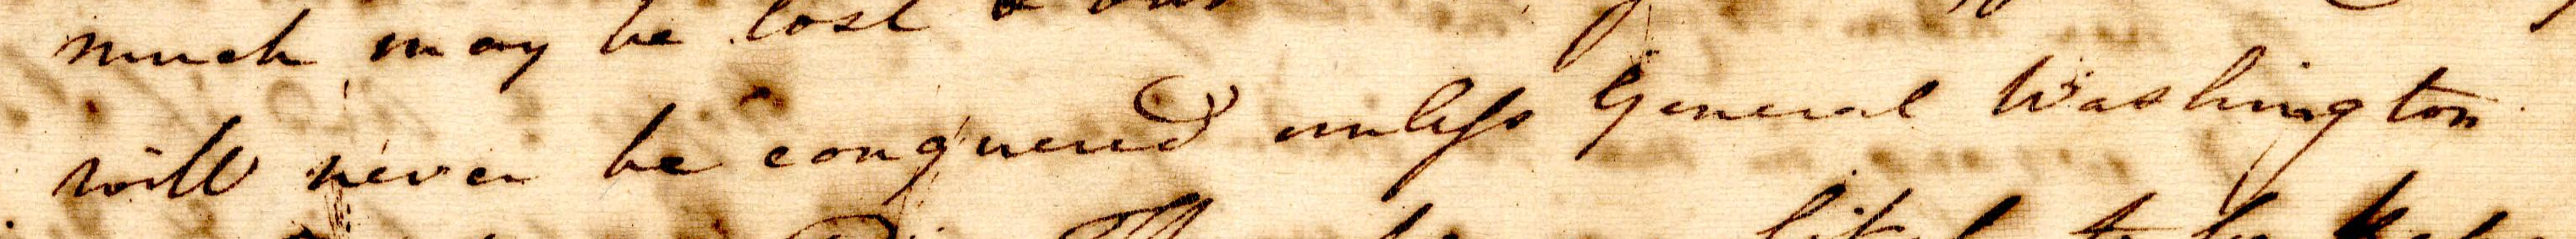will never be conquered unless General Washing ton
